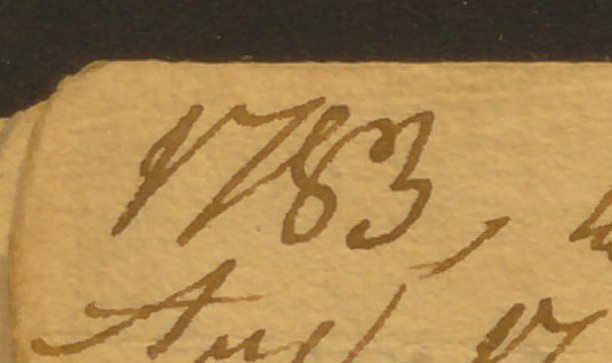1783,
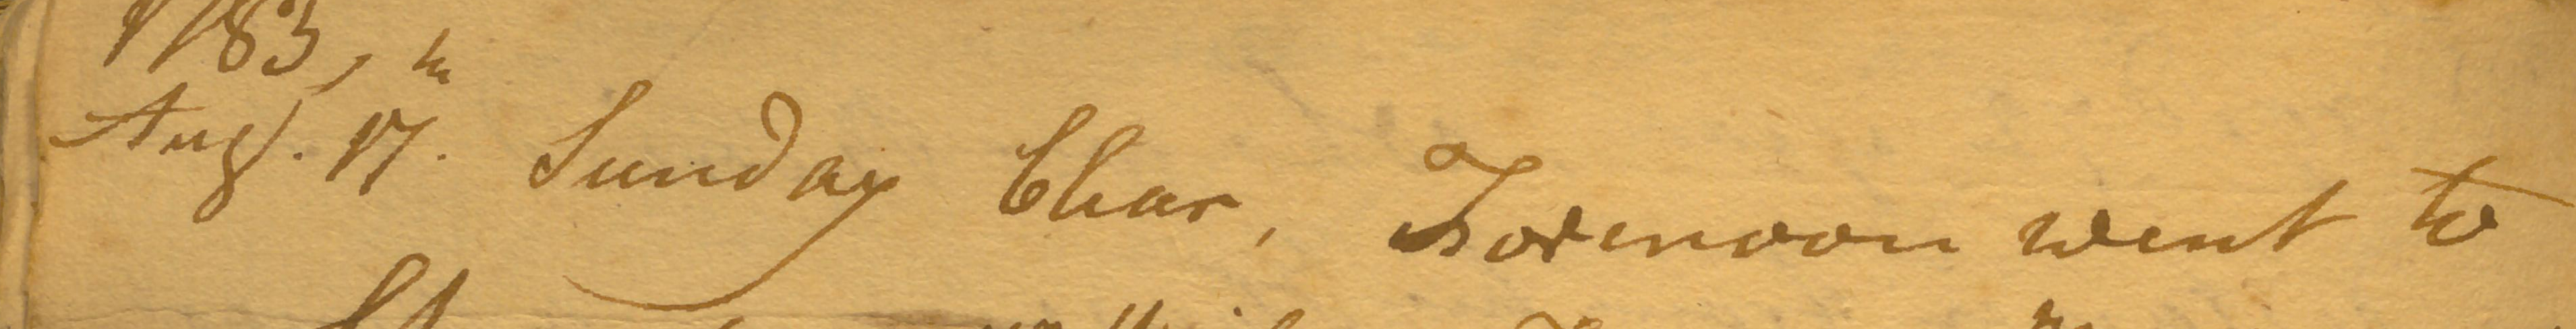Aug^t. 17^th Sunday Clear Forenoon went
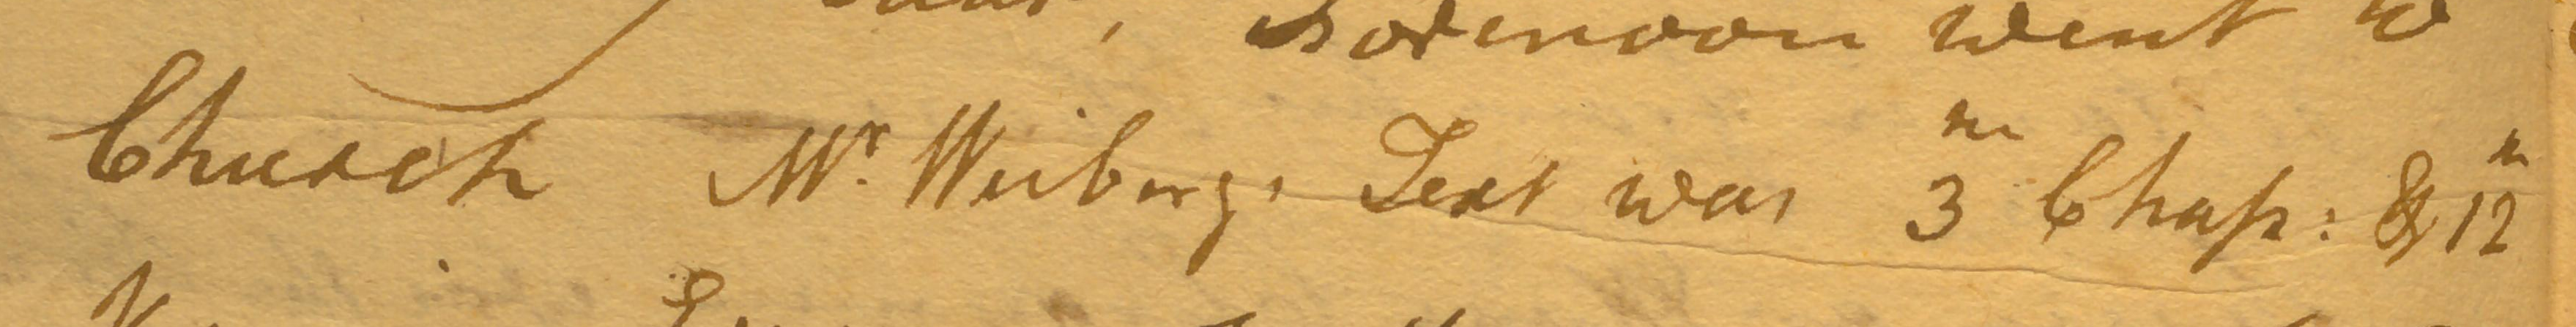Church M^r. Weibergs Text was 3^th Chap: & 12^th
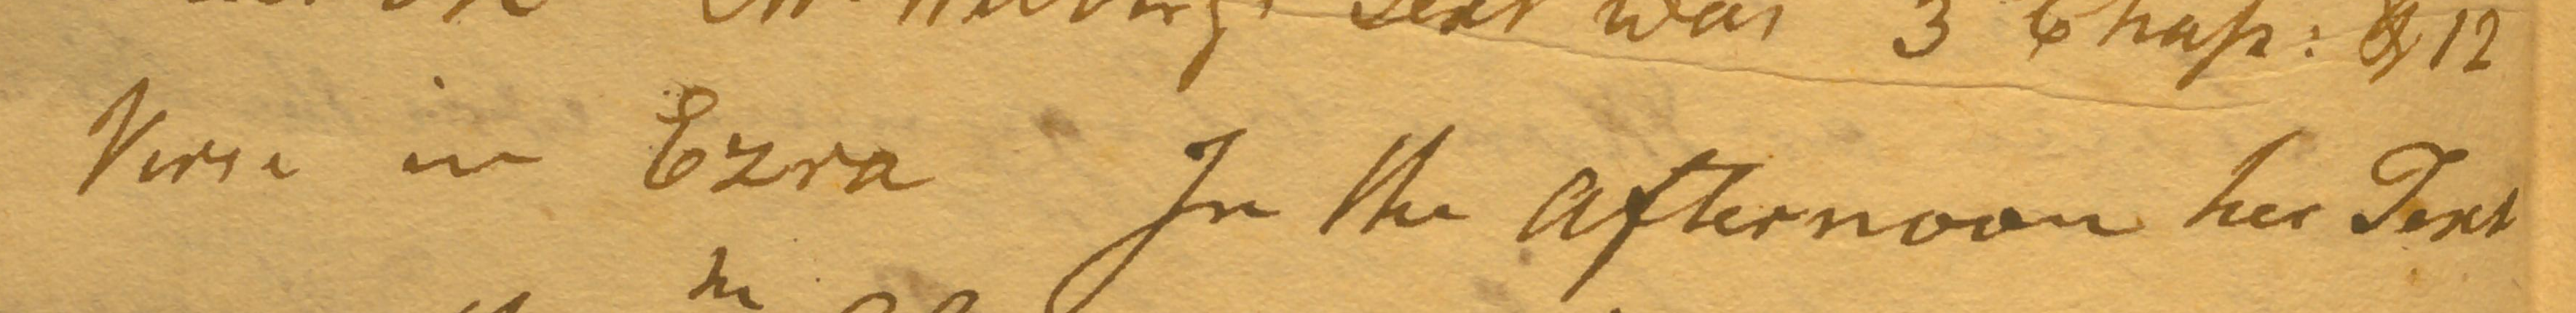Verse in Ezra In the afternoon his Text
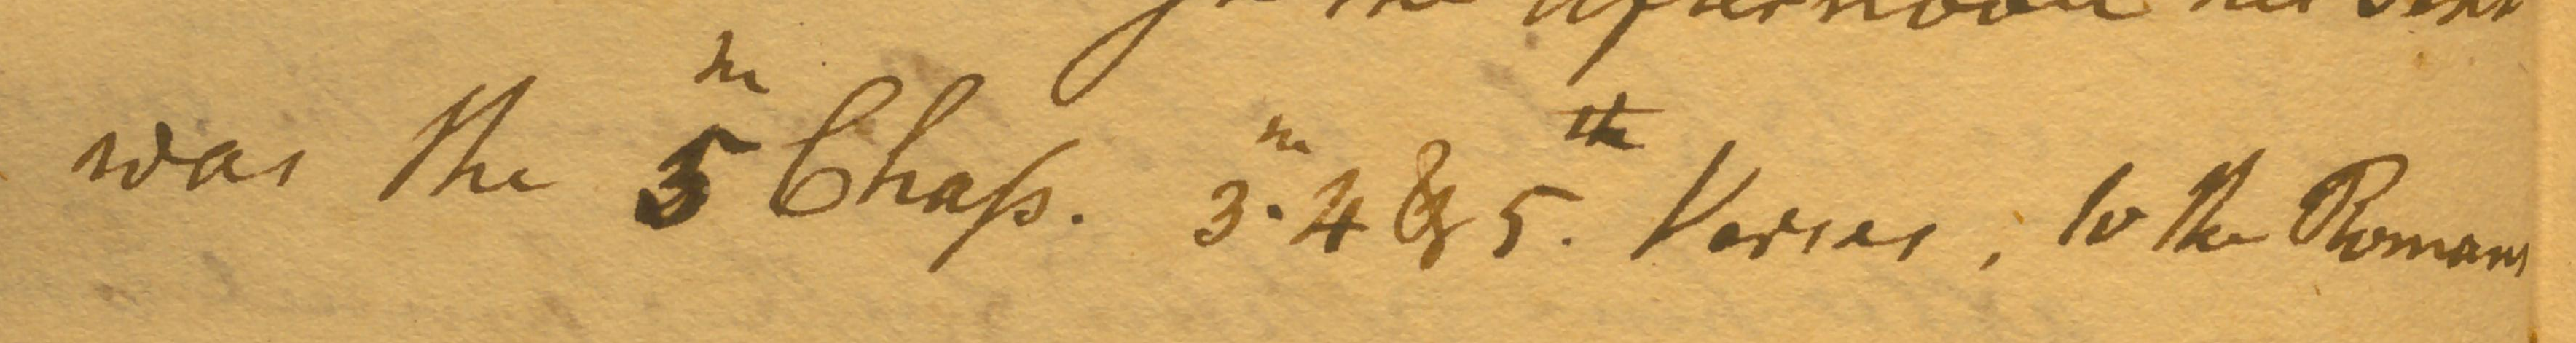was the 5^th Chap. 3^th. 4 & 5th. Verses, to the Roman
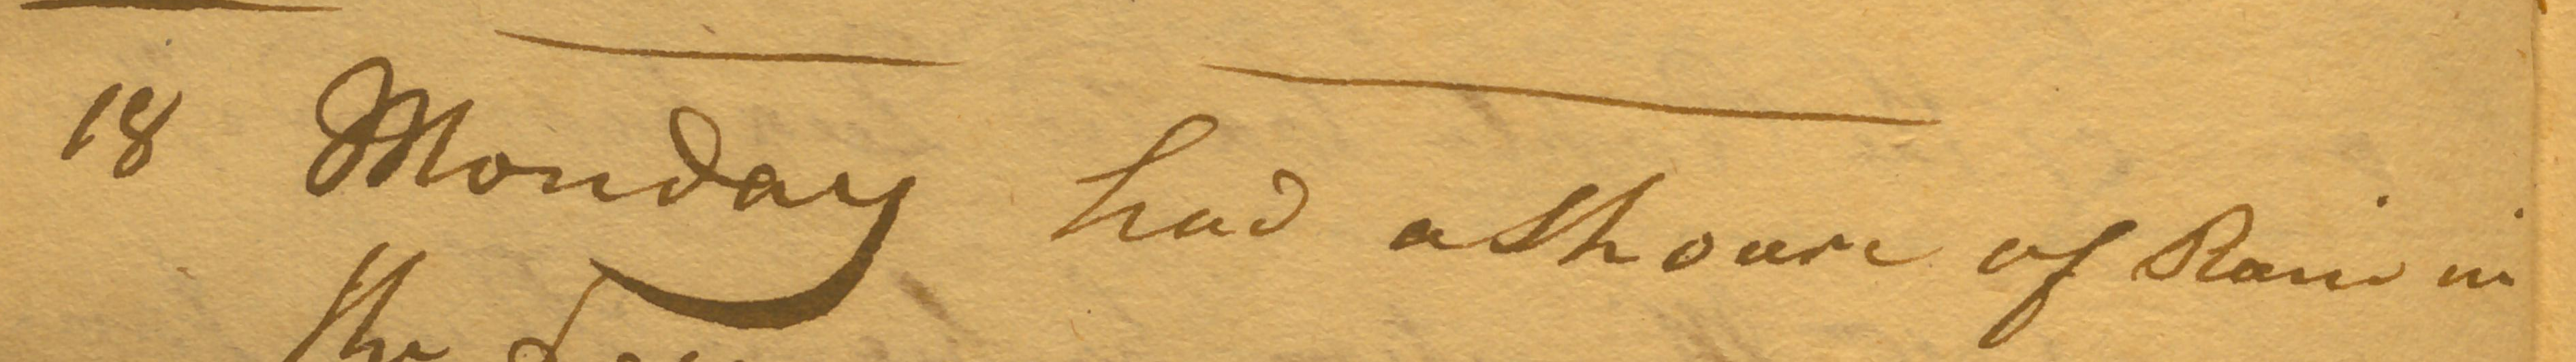18 Monday had a shoure of Rain in
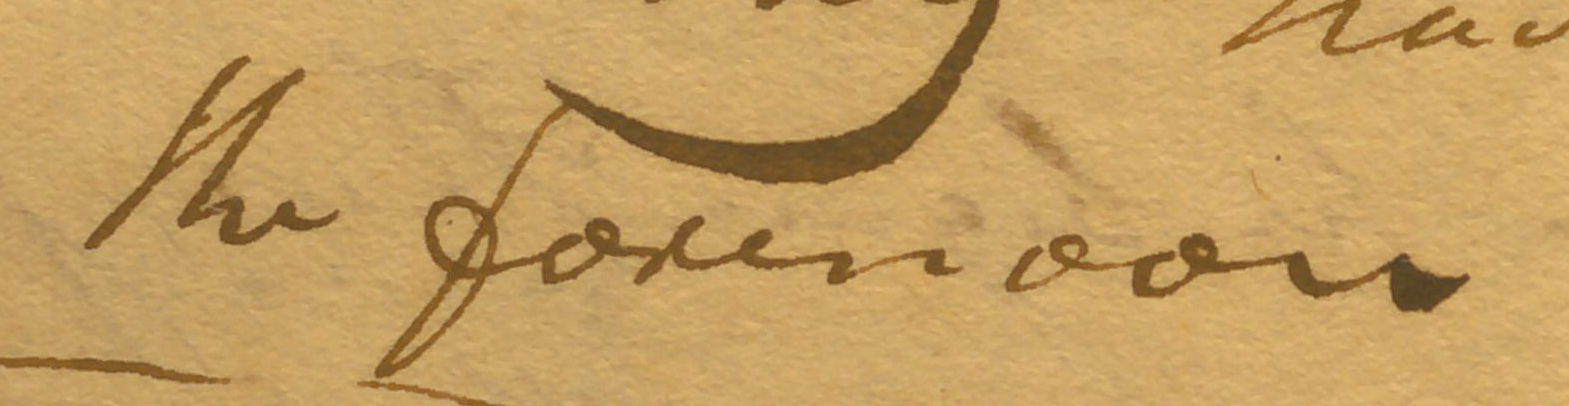the forenoon
